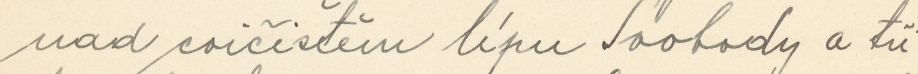nad cvičištěm lípu Svobody a tři
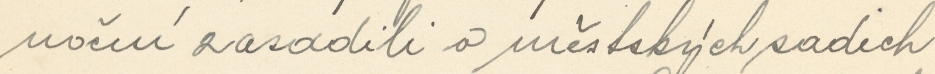noční zasadili v městských sadech
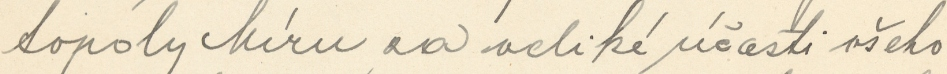topoly Míru za veliké účasti všeho
